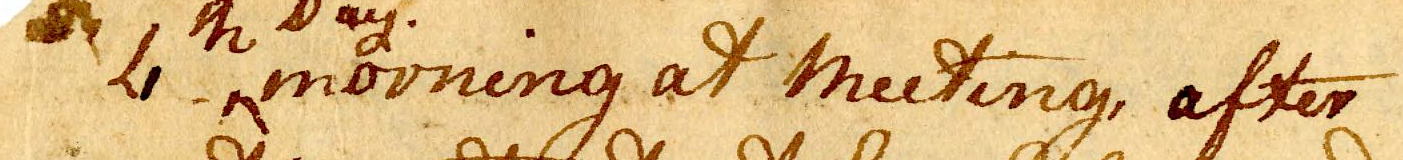4^th ^Day morning at Meeting, after
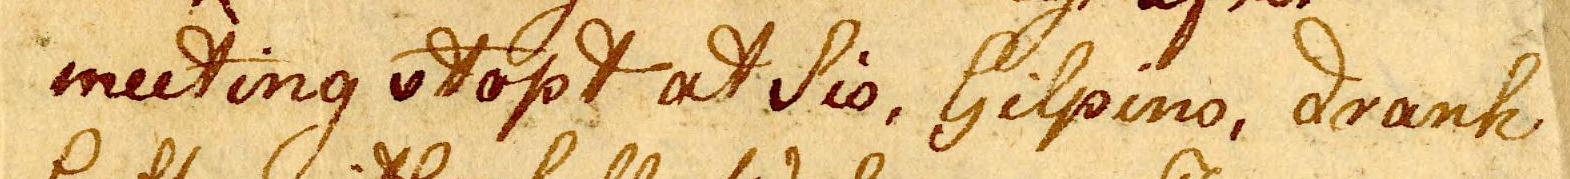meeting stopt at Sis. Gilpins, drank
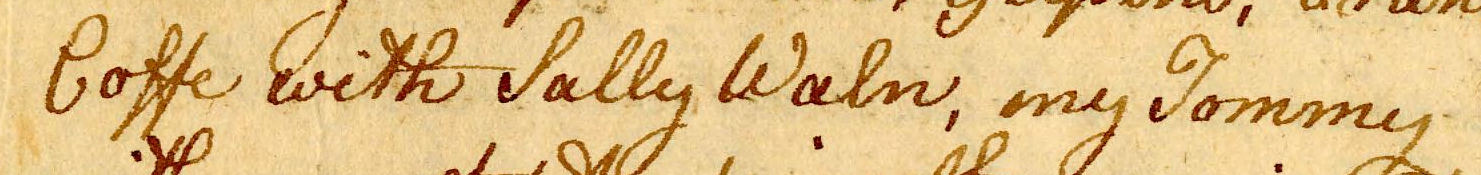Coffe with Sally Waln, my Tommy
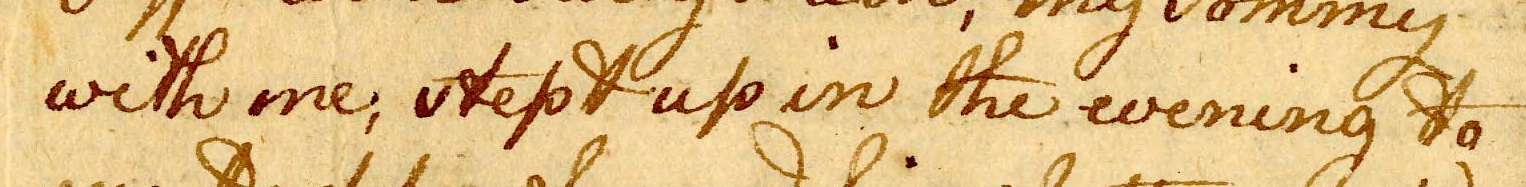with me, stept up in the evening to
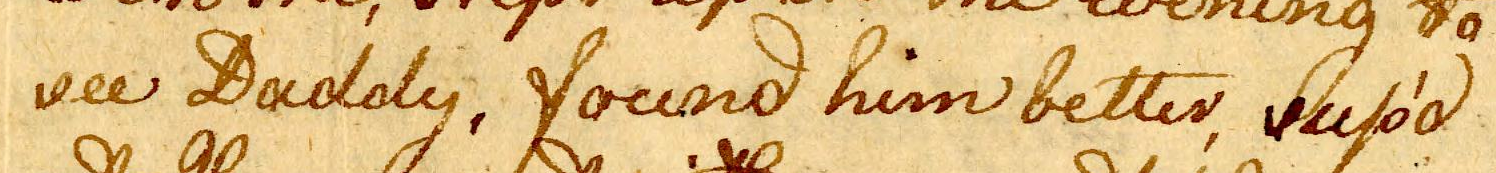see Daddy, found him better, sup'd
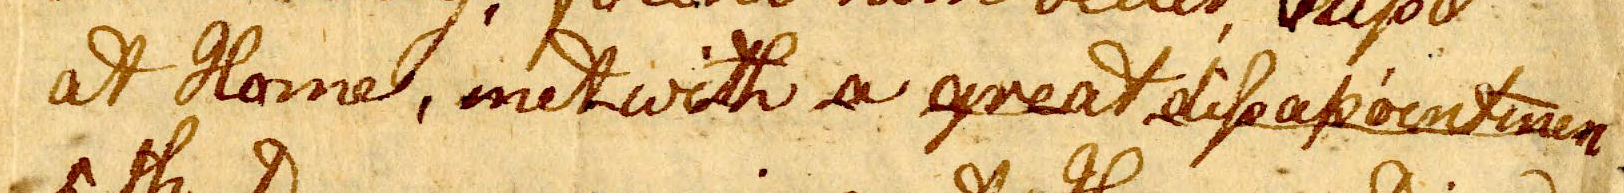at Home, met with a great dissapointmen
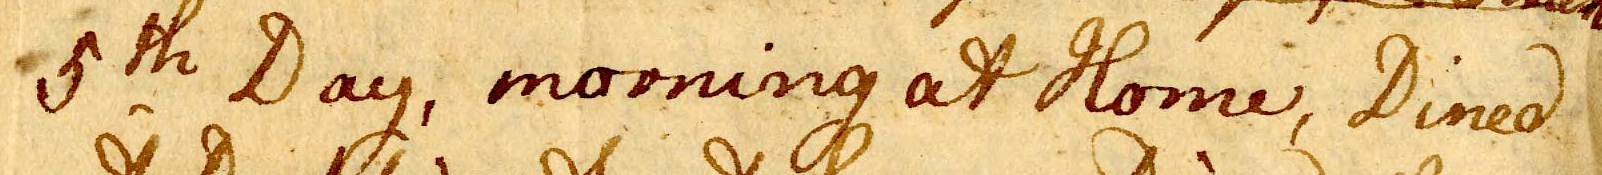5^th Day, morning at Home, Dined
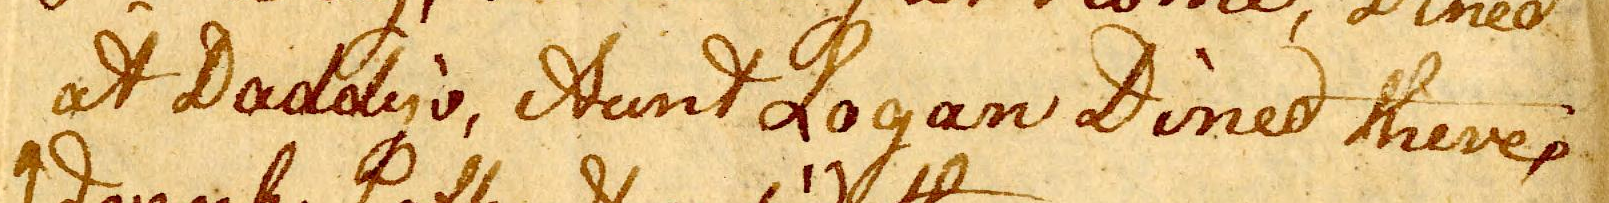at Daddy's, Aunt Logan Dined there
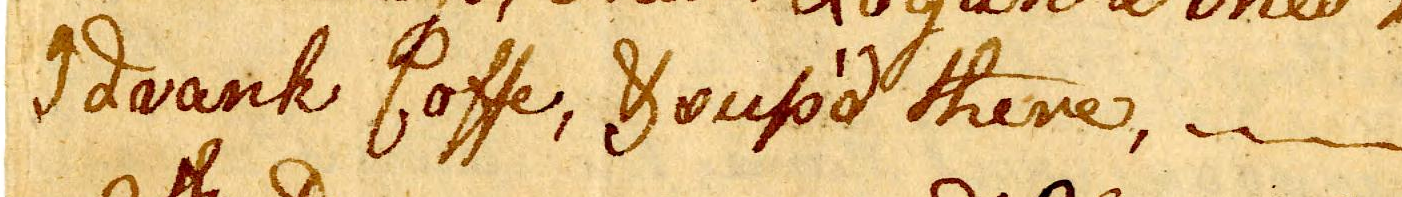I drank Coffe, & sup'd there,-
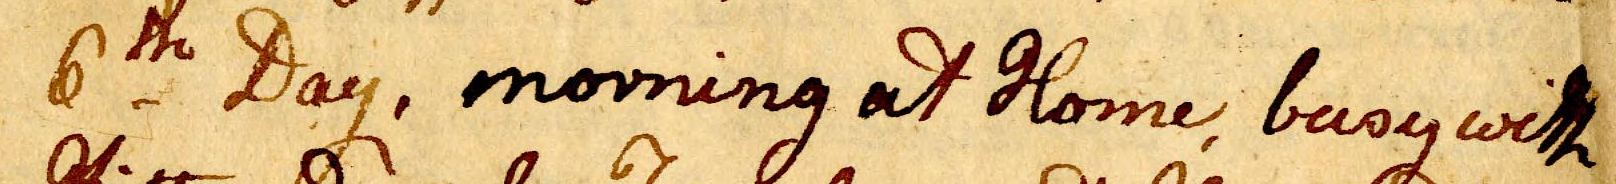6^th Day, morning at Home, busy with
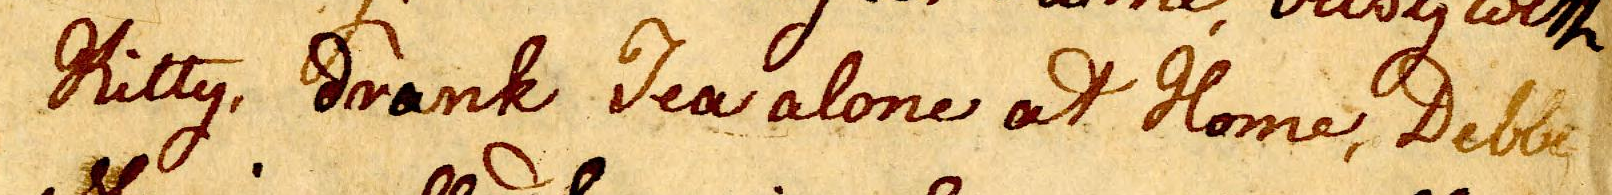Kitty, drank Tea alone at Home, Debby
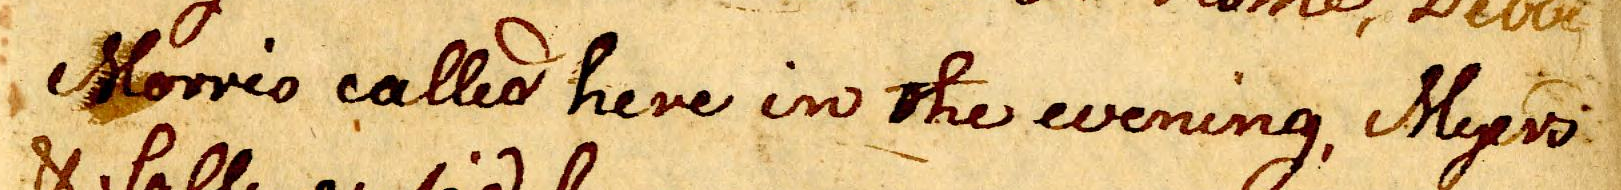Morris called here in the evening, Myers
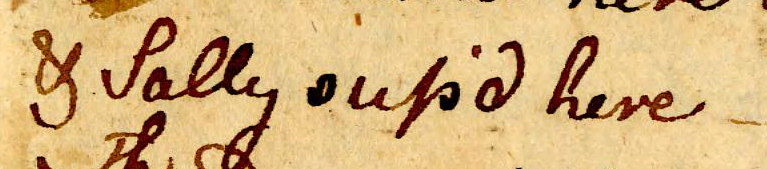& Sally sup'd here -
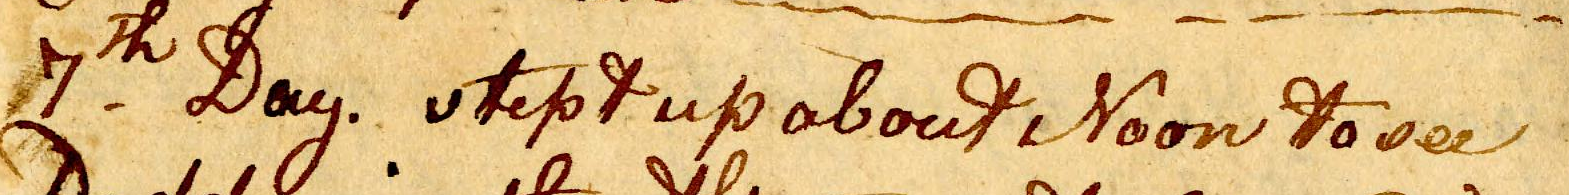7^th Day. stept up about Noon to see
